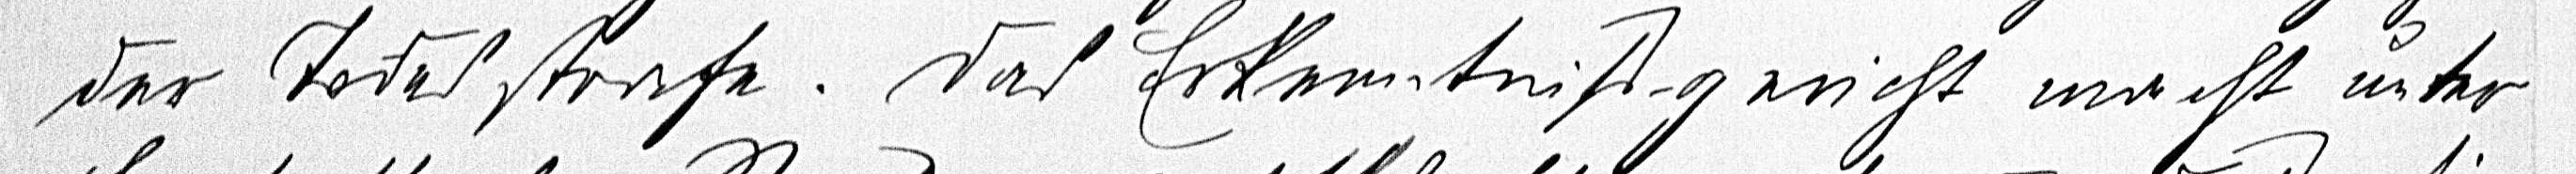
der Todesstrafe. Das Erkenntniß-gericht macht unter
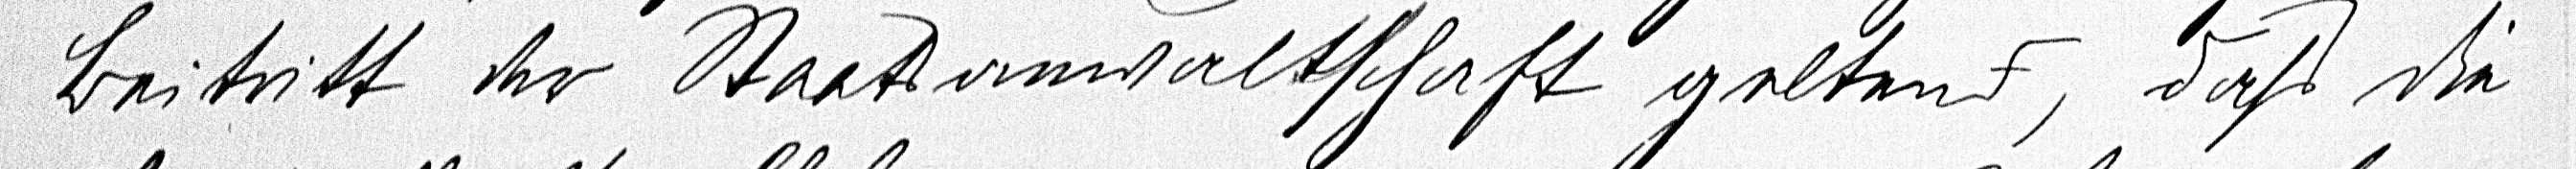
Beitritt der Staatsanwaltschaft geltend, daß die
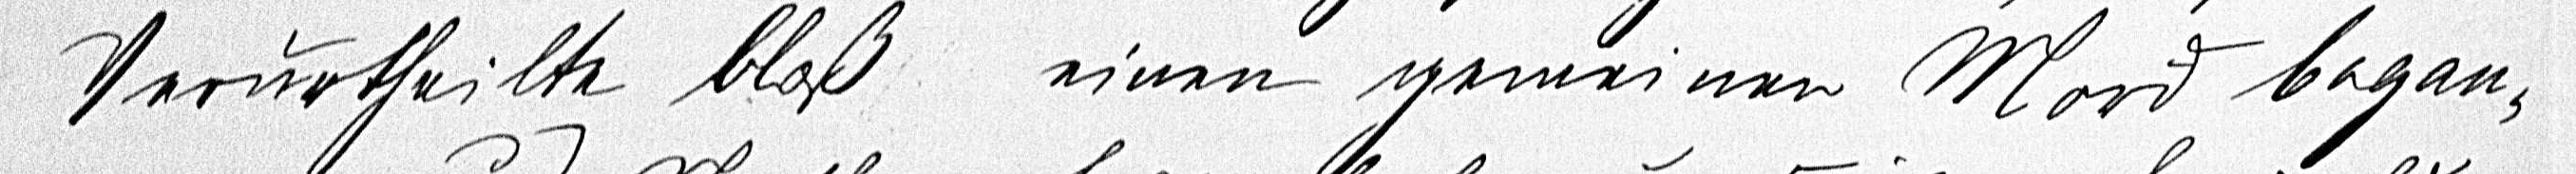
Verurtheilte bloß einen gemeinen Mord began¬
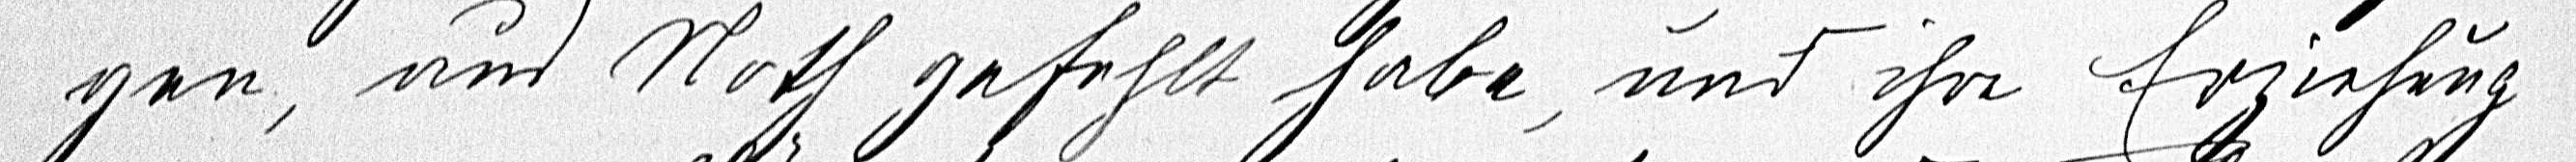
gen, aus Noth gefehlt habe, ihre Erziehung
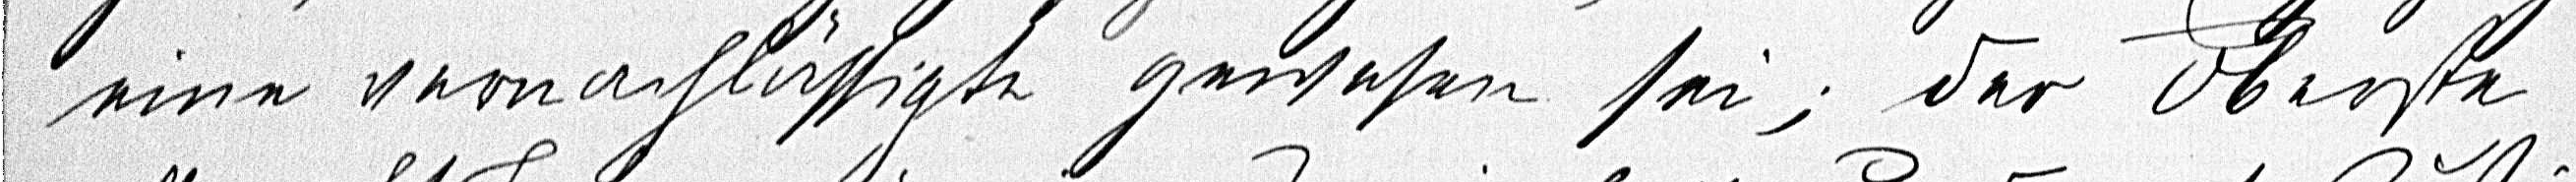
eine vernachlässigte gewesen sei; der Oberste
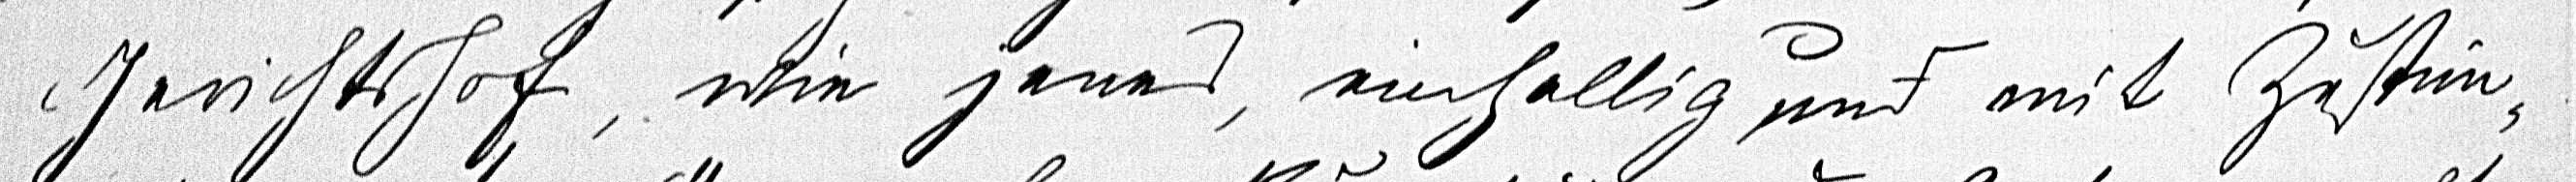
Gerichtshof, wie jenes, einhellig und mit Zustim¬
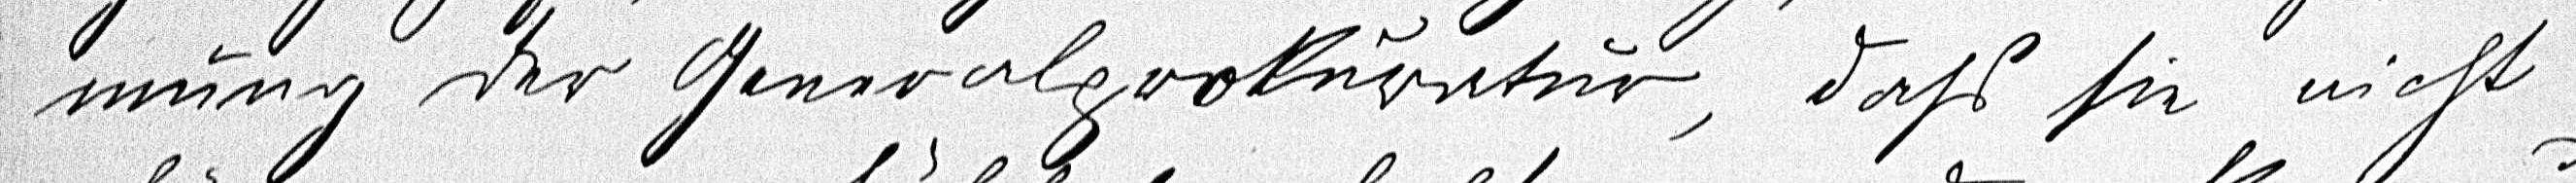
mung der Generalprokuratur, daß sie nicht
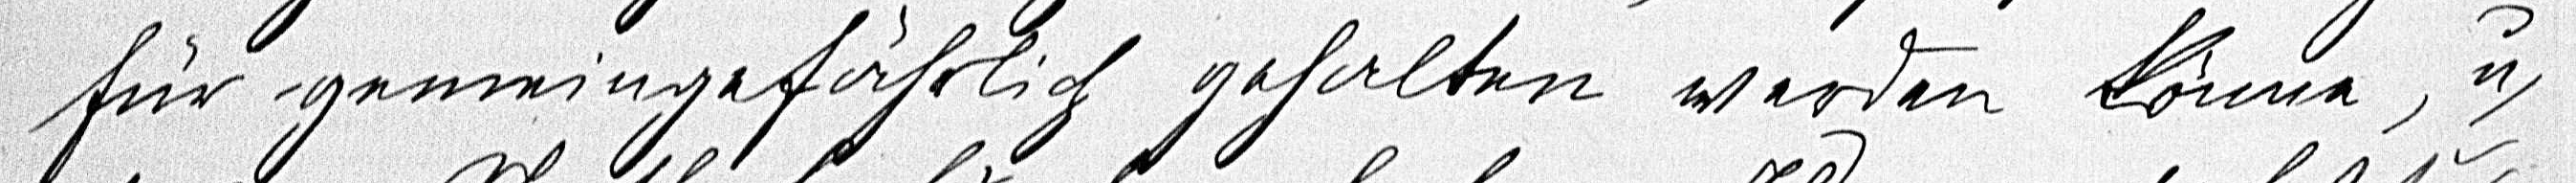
für gemeingefährlich gehalten werden könne, u.
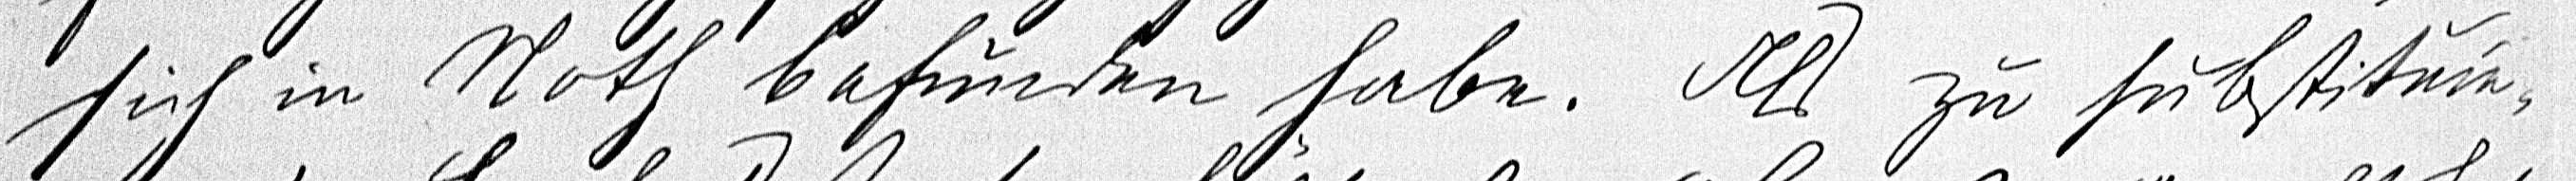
sich in Noth befunden habe. Als zu substituie¬
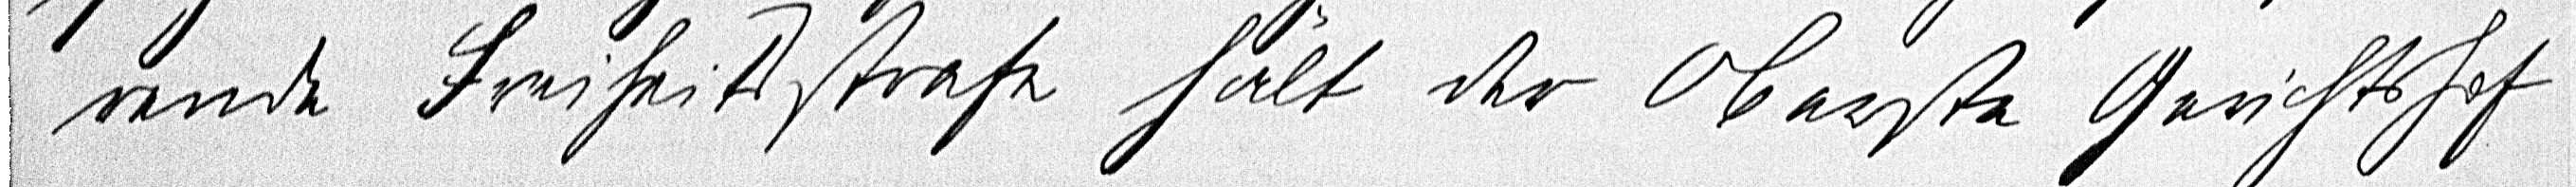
rebde Freiheitsstrafe hält der Oberste Gerichtshof
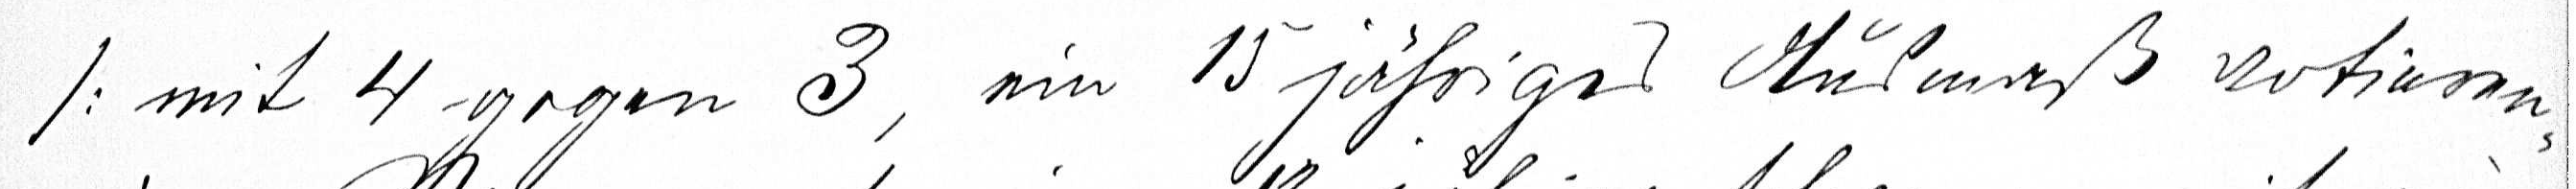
(mit (4 gegen 3, ein 15jähriges Ausmaß votieren¬
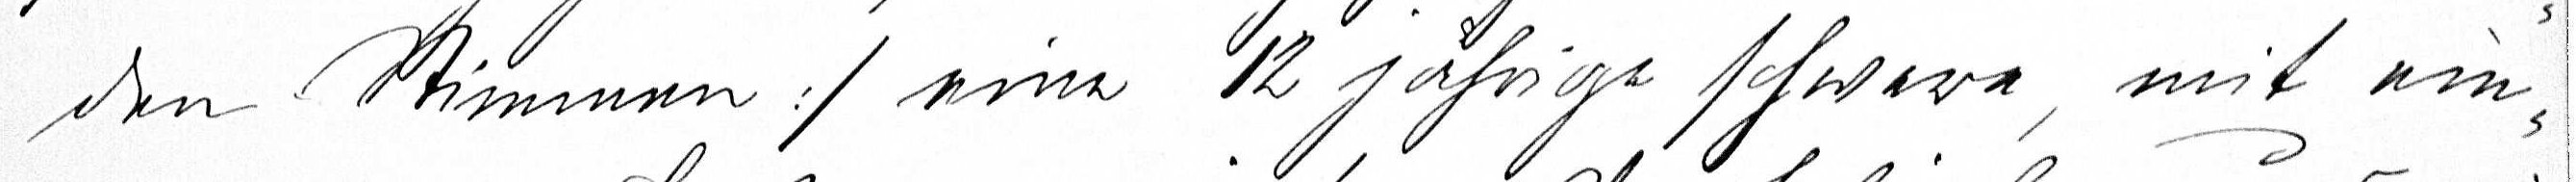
den Stimmen) eine 12 jährige schwere, mit ein¬
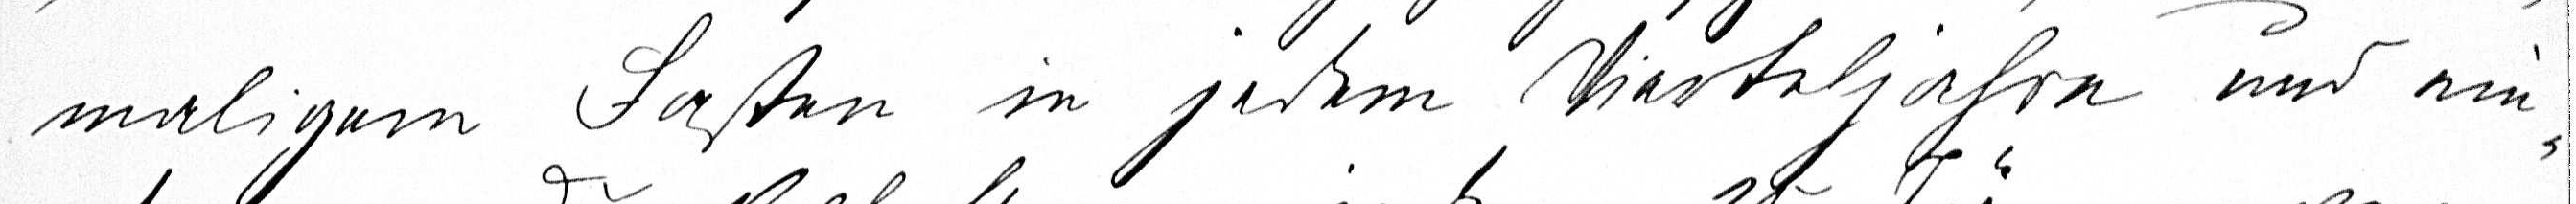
maligem Fasten in jedem Vierteljahre und ein¬
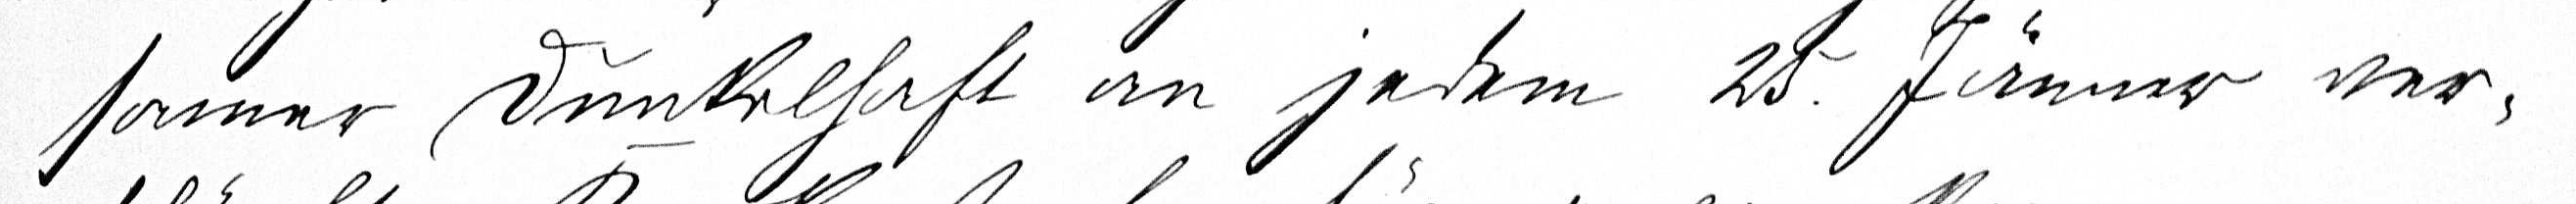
samer Dunkelhaft an jedem 25. Jänner ver¬
